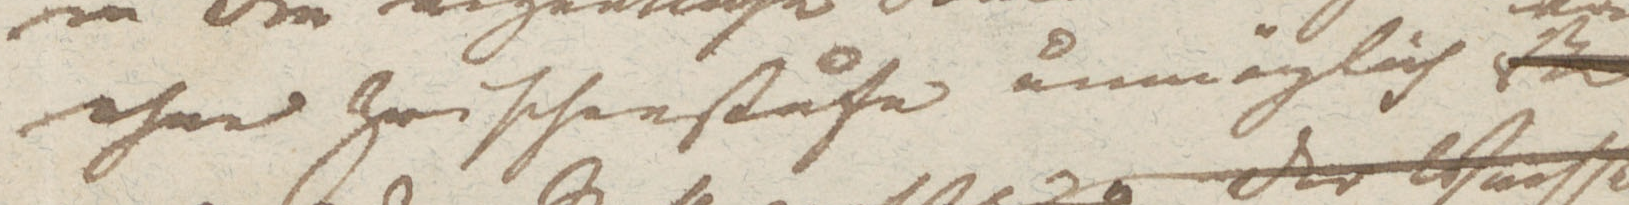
ohne Zwischenstufe unmöglich ist;
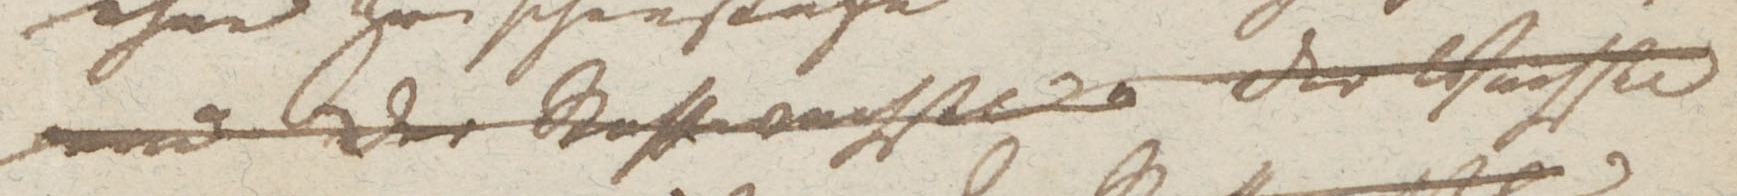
und der Stoffwechsel der Wechsel
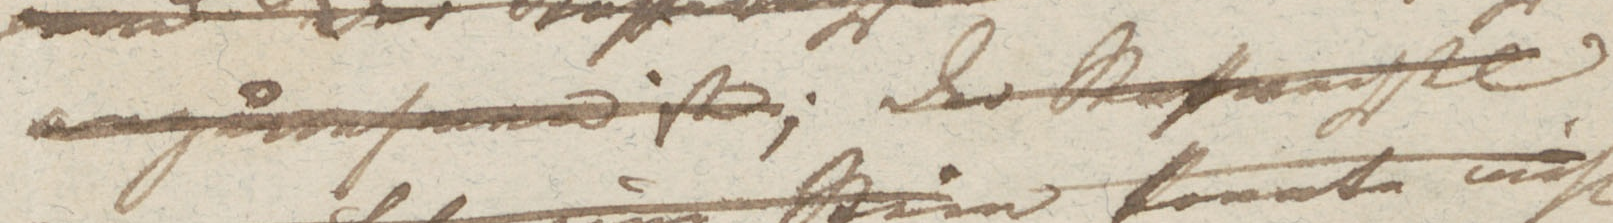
anzunehmen ist; Der Stoffwechsel
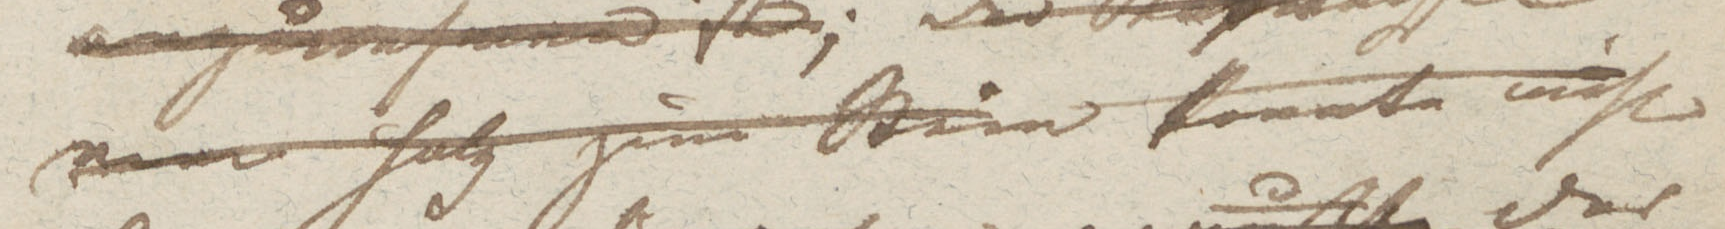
vom Holz zum Stein konnte nicht
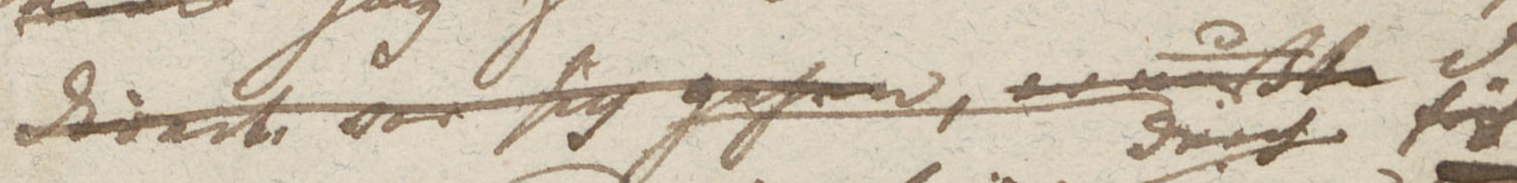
direct vor sich gehen, er musste der
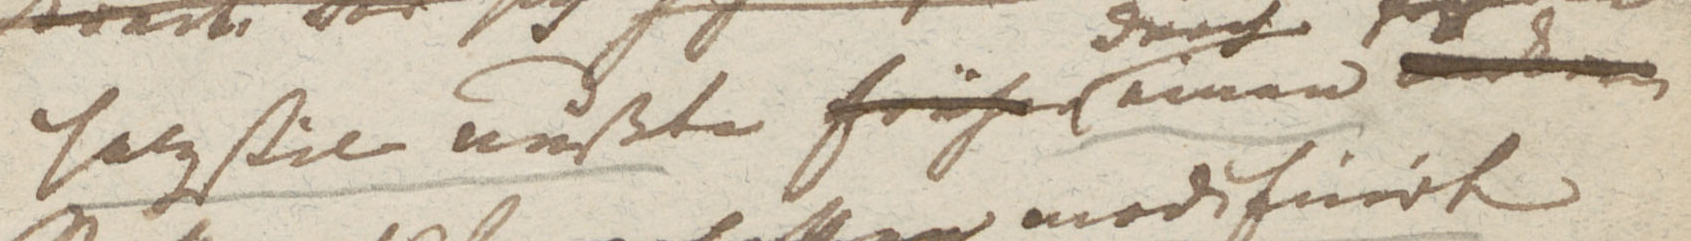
Holzstil musste früher durch einen früheren anderen
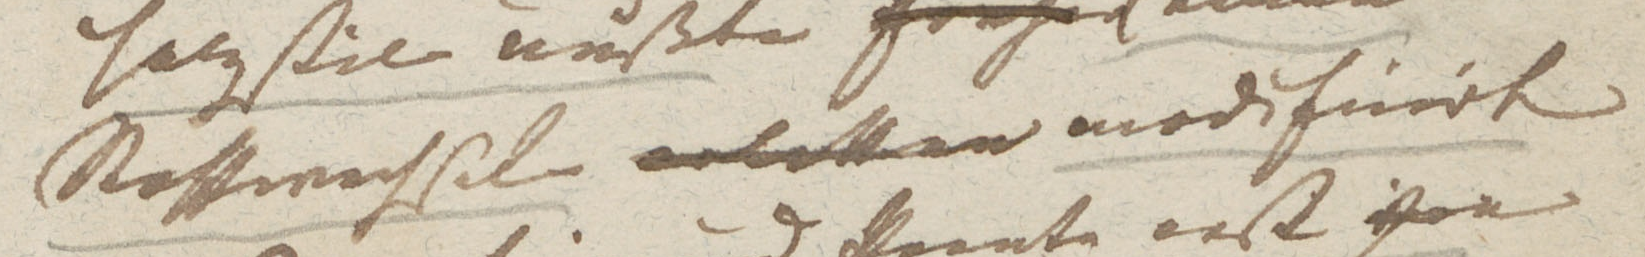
Stoffwechseln erbitten modificirt
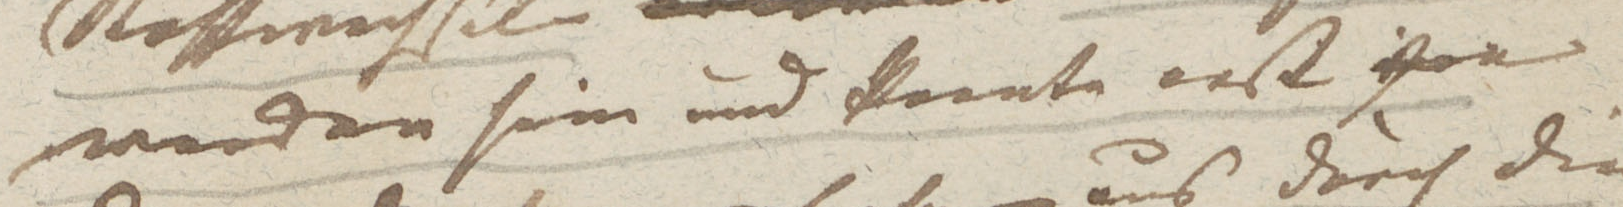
worden sein und konnte erst von
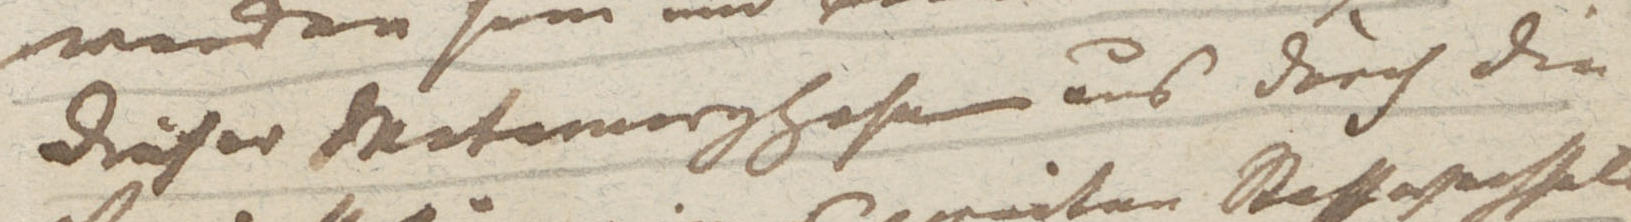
dieser Metamorphose aus durch die
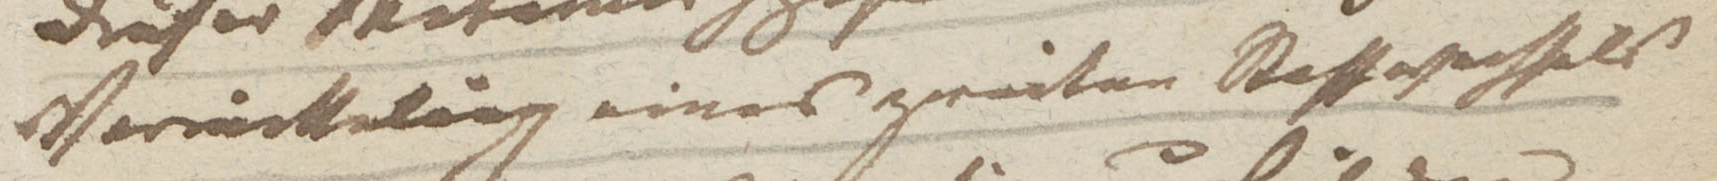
Verwicklung eines zweiten Stoffwechsels
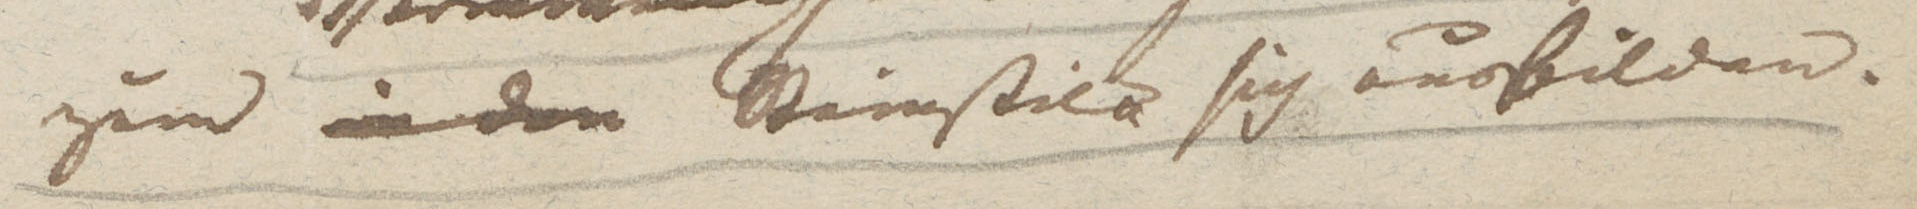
zum in den Steinstile sich ausbilden.
